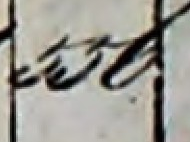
556
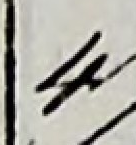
4
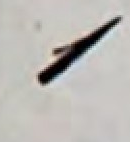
1
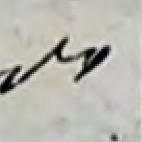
do
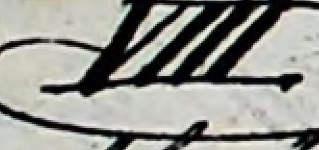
VIII.
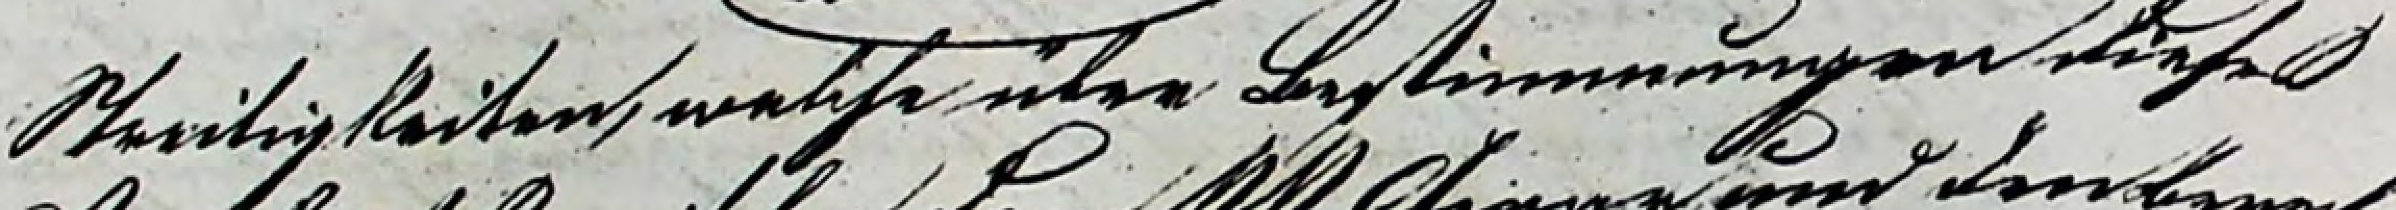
Streitigkeiten, welche über Bestimmungen dieses
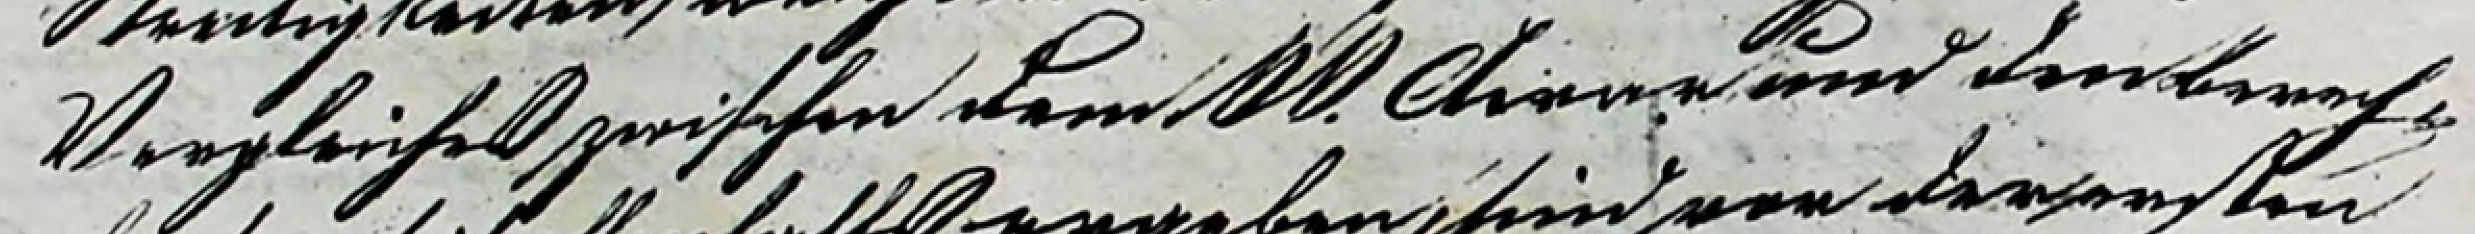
Vergleiches zwischen dem kk. Aerar und den berech„
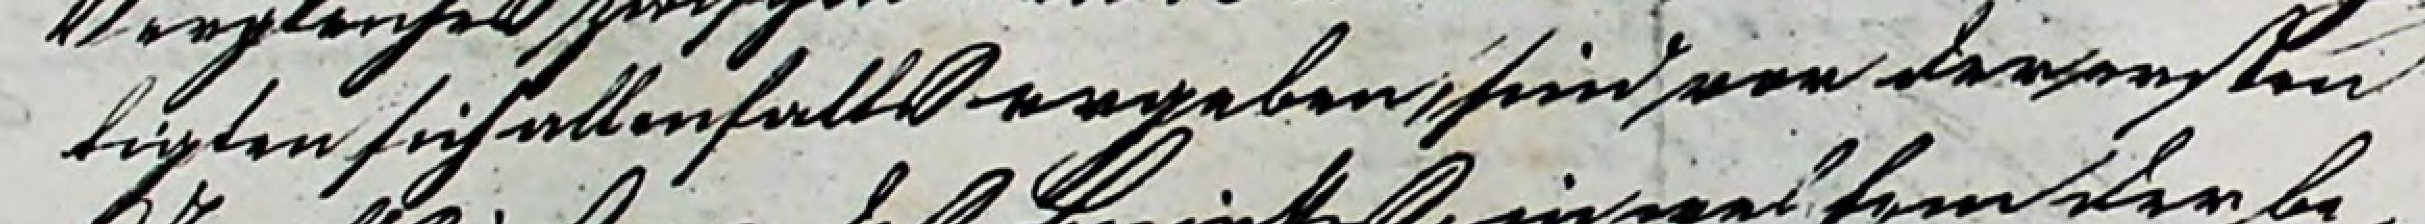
tigten sich altenhalts ergeben, sind vor der ersten
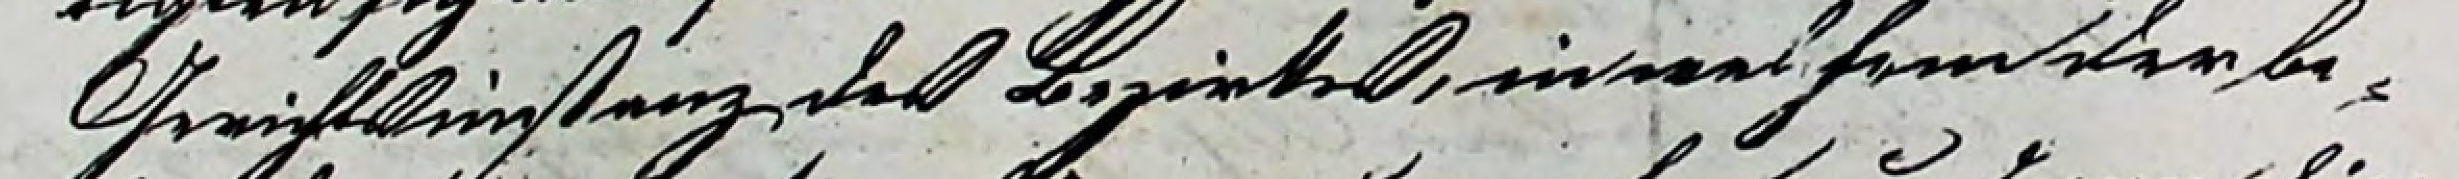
Gerichtsinstanz des Bezirkes, in welchem der be„
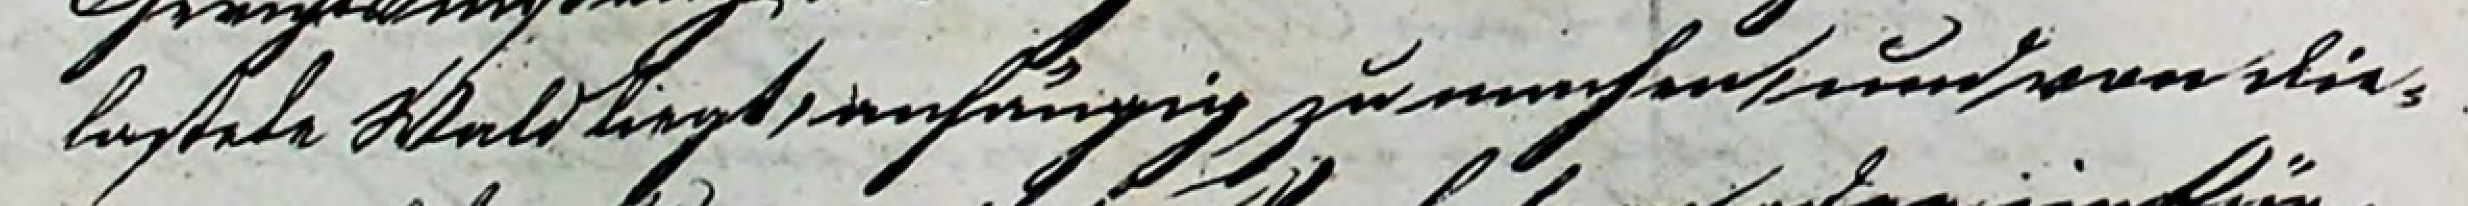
lastete Wald liegt, anhängig zu machen, und von die„
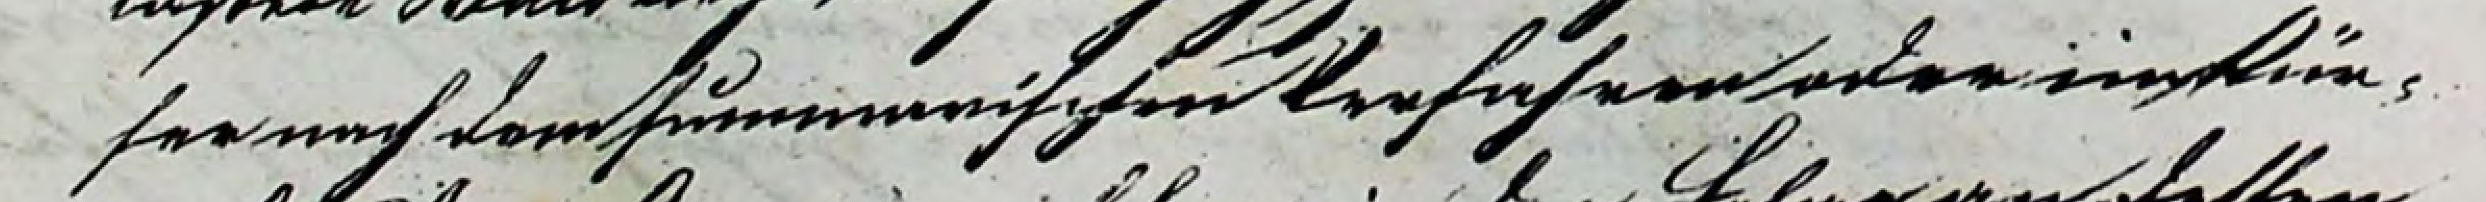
ser nach dem summarischen Verfahren oder im kür„
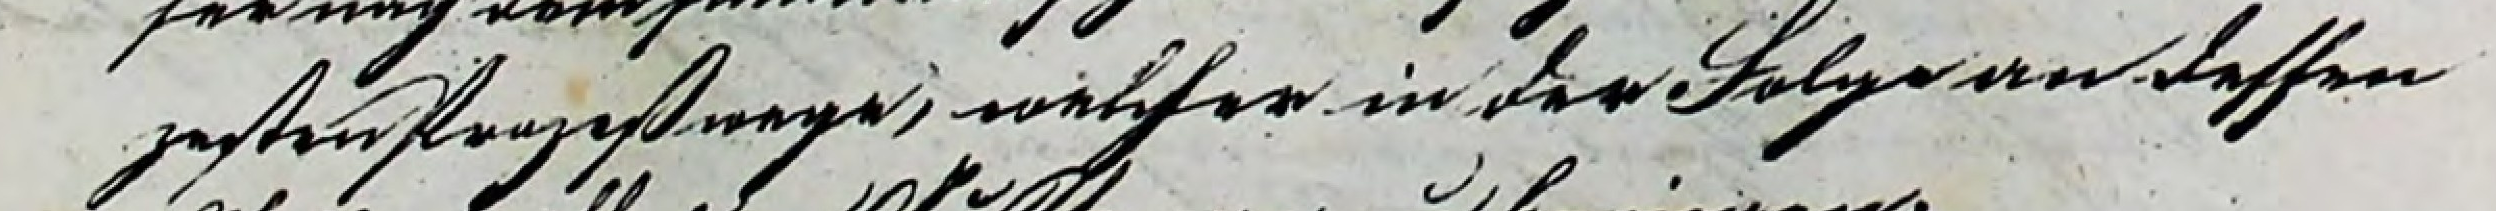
zesten Prozeßwege, welcher in der Folge an dessen
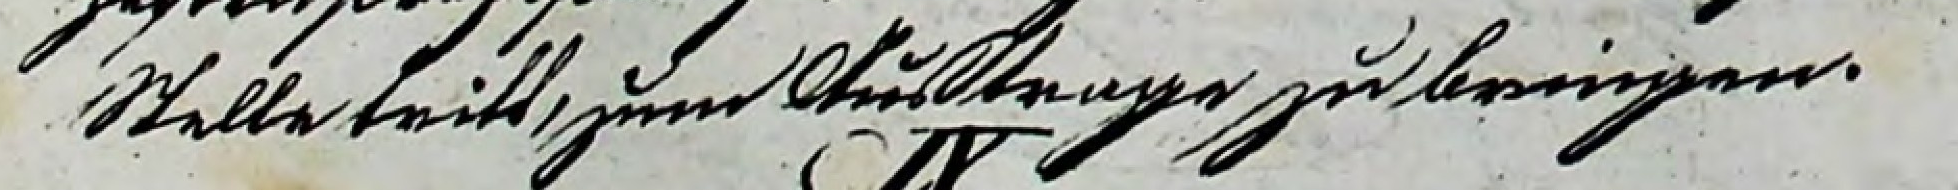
Stelle tritt, zum Austrage zu bringen.
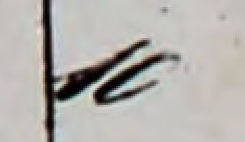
10
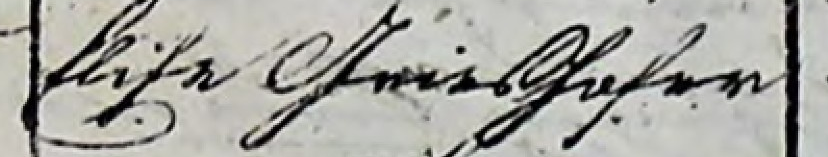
Elise Geies Hofer
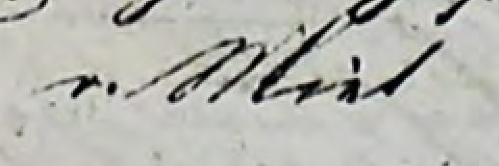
v. Miel
